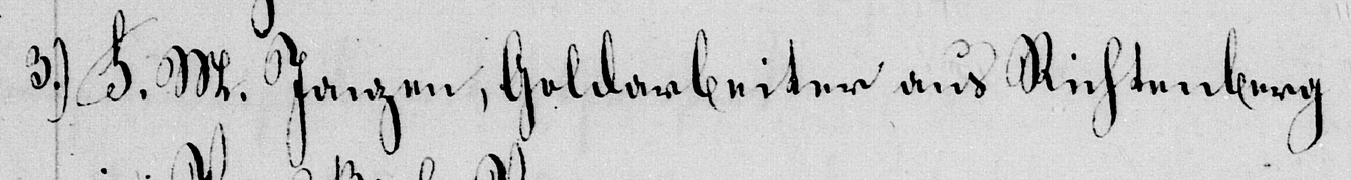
3.) F. M. Janzen, Goldarbeiter aus Richtenberg
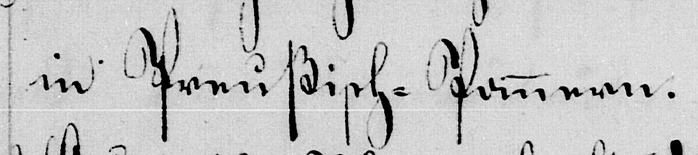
in Preußisch-Pommern.
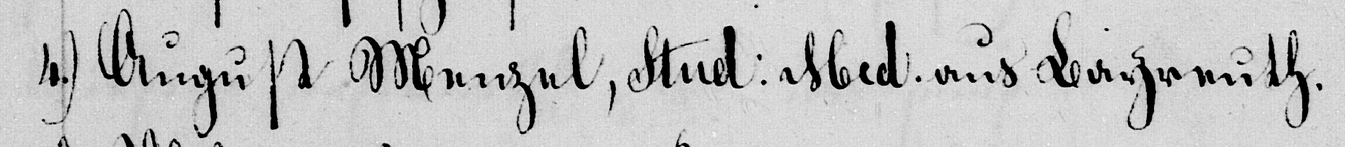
4.) August Menzel, Stud: Med. aus Bayreuth.
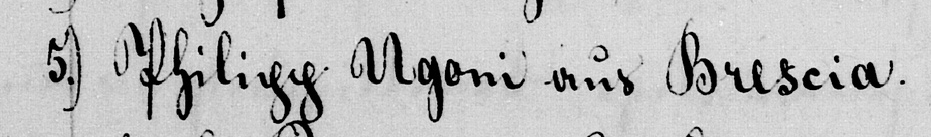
5.) Philipp Ugoni aus Brescia.
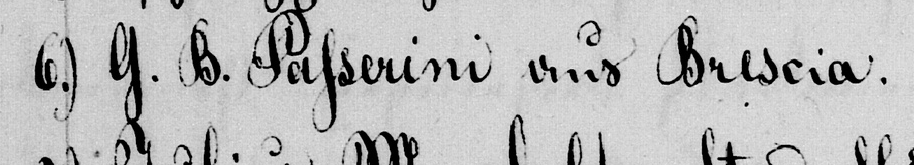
6.) G. B. Passerini aus Brescia.
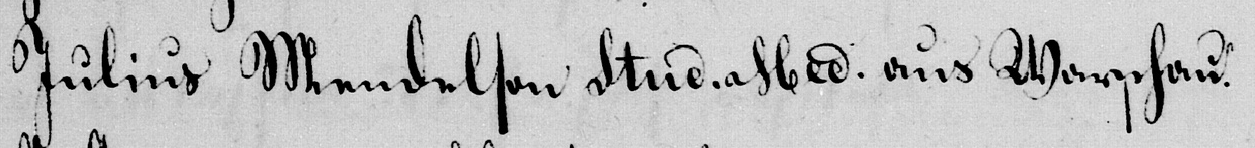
Julius Mendelson Stud. Med. aus Warschau.
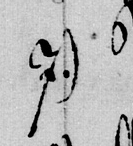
7.)
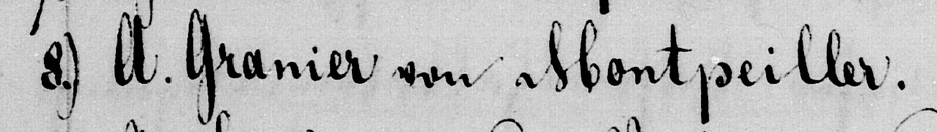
8.) A. Granier von Montpeiller.
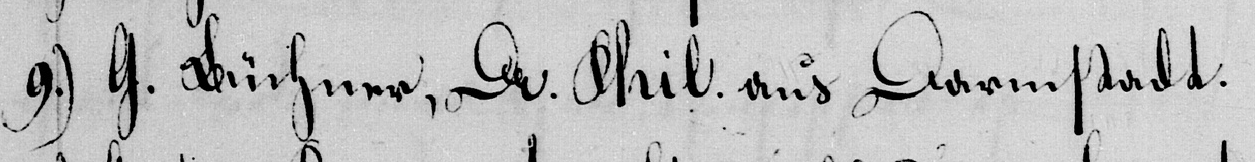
9.) G. Büchner, Dr. Phil. aus Darmstadt.
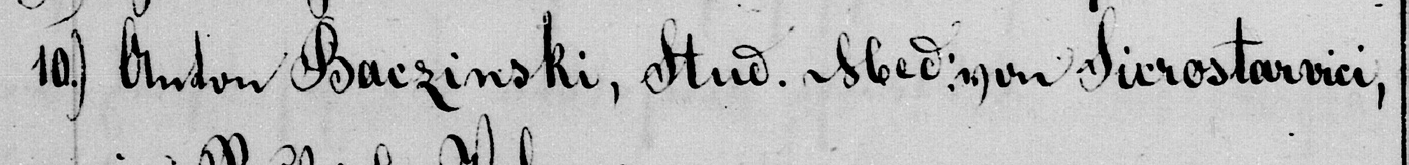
10.) Anton Baczinski, Stud. Med: von Sicrostarvici,
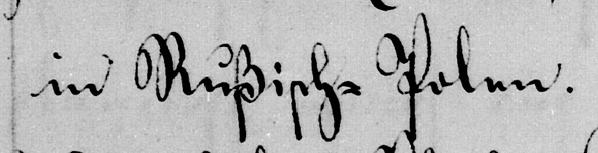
in Rußisch-Polen.
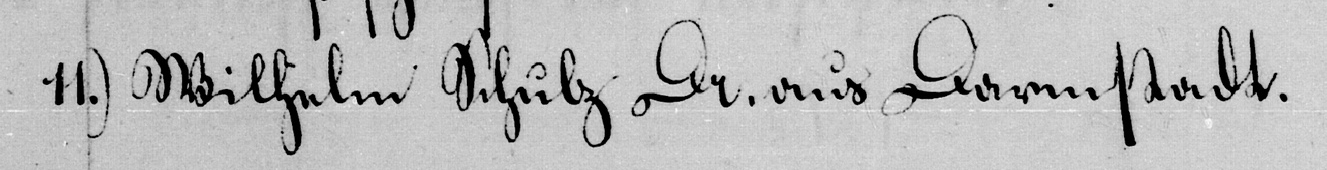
11.) Wilhelm Schulz Dr. aus Darmstadt.
